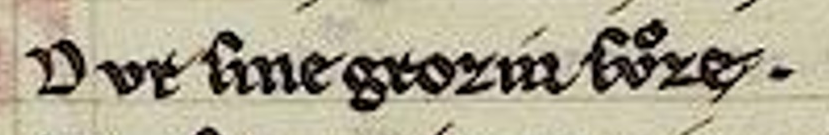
Dvr ſine grozin ſv°oze.
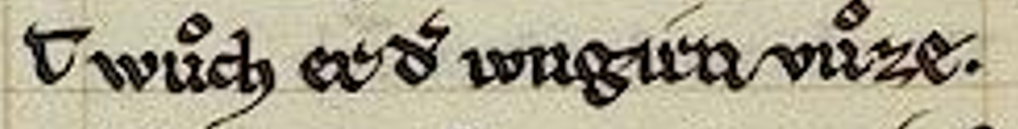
Twu°och er d(er) ivngirn vu°oze.
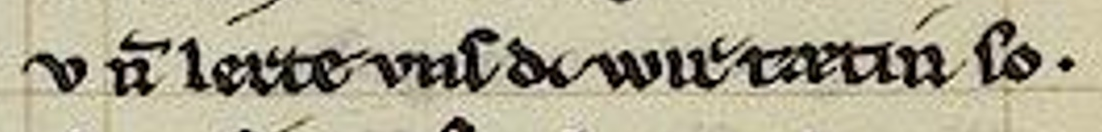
Vn(d) lerte vnſ d(az) wir t[ae]tin ſo.
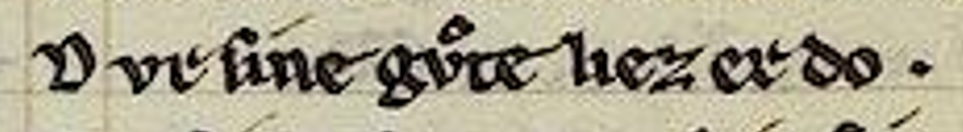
Dvr ſine gv°ote liez er do.
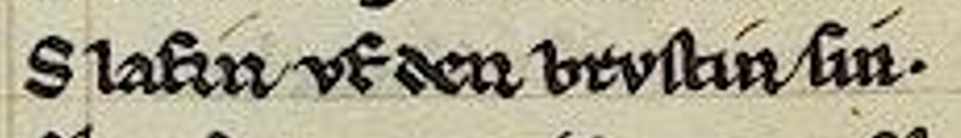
Slafin vf den brvſtin ſin.
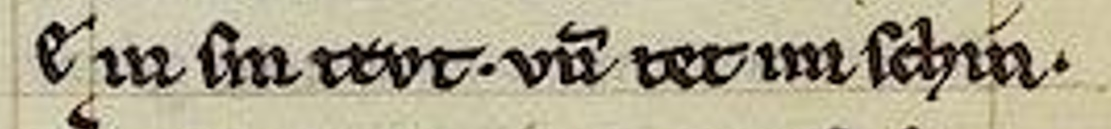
Ein ſin trvt. vn(d) tet im ſchin.
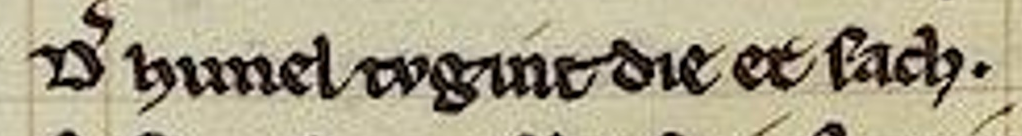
D(er) himel tvgint die er ſach.
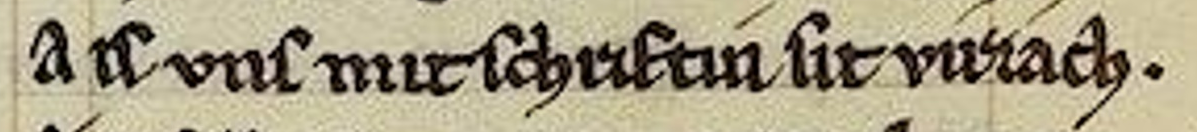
Alſ vnſ mit ſchriftin ſit viriach.
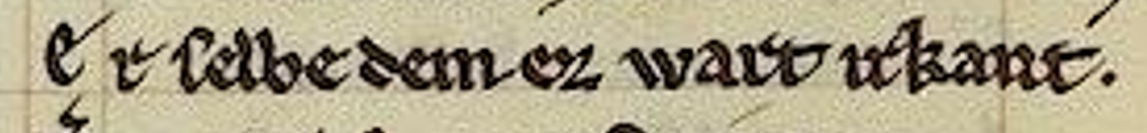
Er ſelbe dem ez wart irkant.
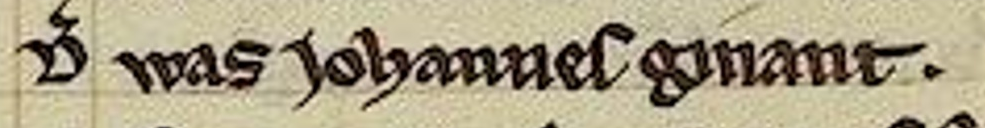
D(er) was Johanneſ ginant.
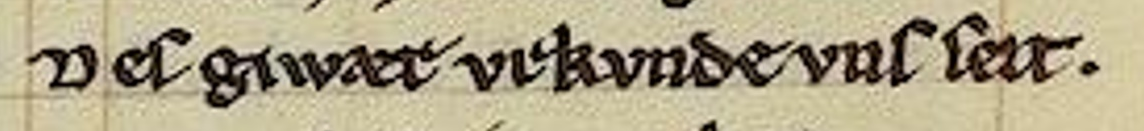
Deſ giw[ae]r vrkvnde vnſ ſeit.
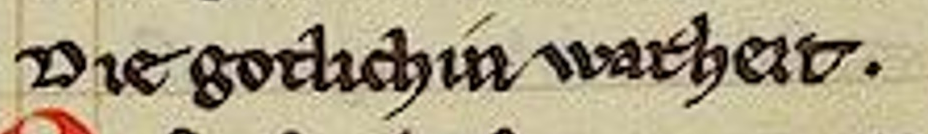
Die gotlichin warheit.
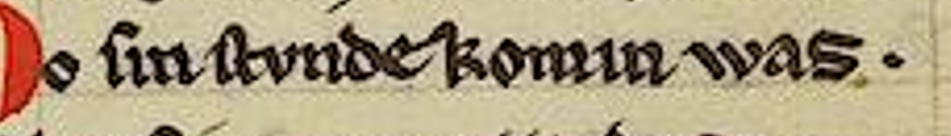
*Do ſin ſtvnde komin was.
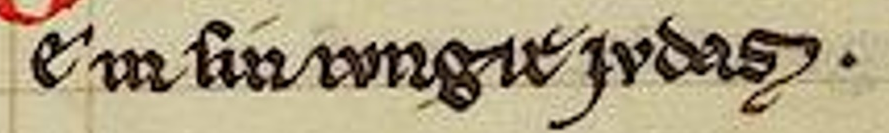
Ein ſin ivngir Jvdas.
